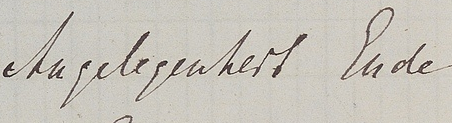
Angelegenheit Ende
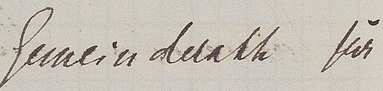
Gemeinderath zur
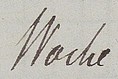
Sprache
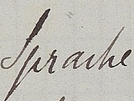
halten
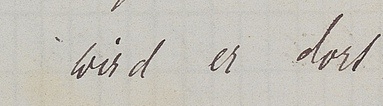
wird er dort
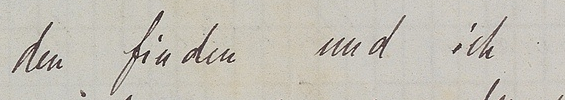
den finden und ich
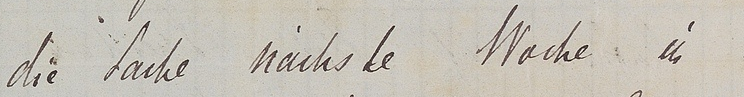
die Sache nächste Woche in
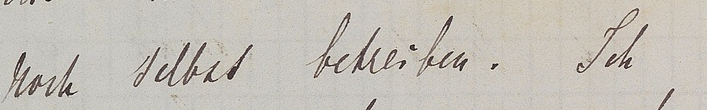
noch selbst betreiben. Ich
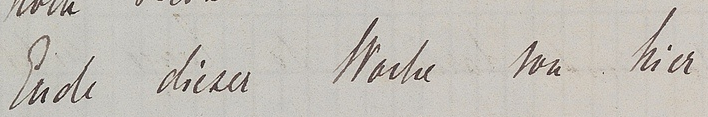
Ende dieser Woche von hier
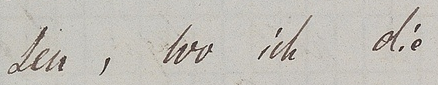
sen, wo ich die
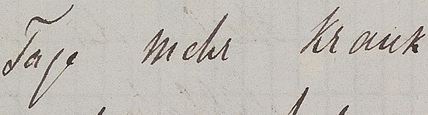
Tage mehr krank
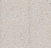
als
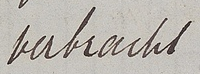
verbracht
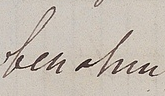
habe. Die
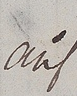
mich
